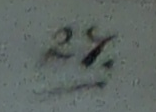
27.
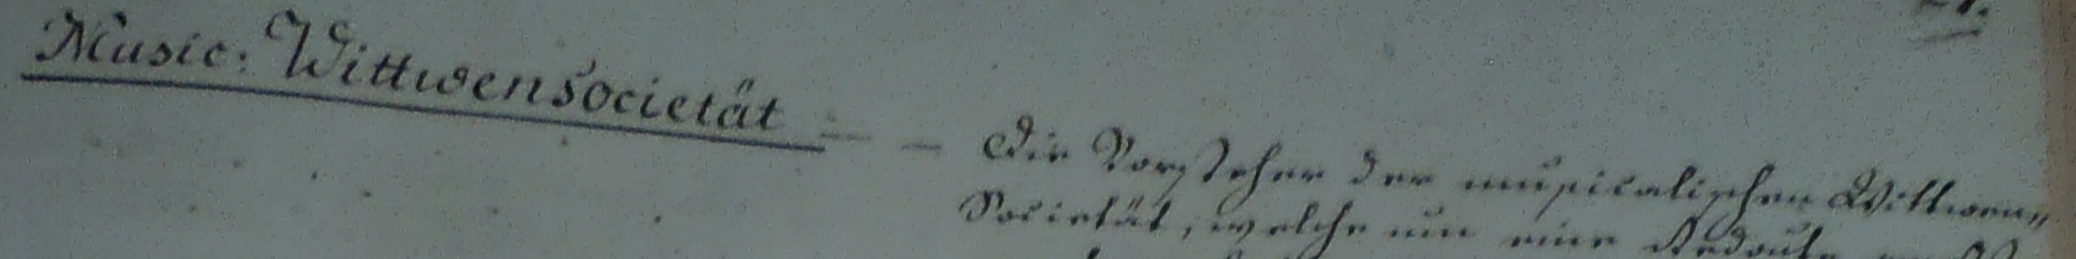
Music: Wittwensocietät _ _ Die Vorsteher der musicalischen Wittwen¬
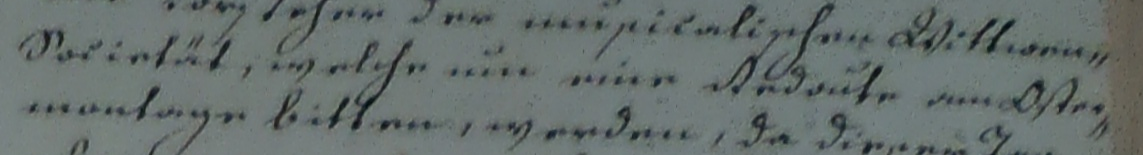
Societät, welche um eine Redoute am Oster¬
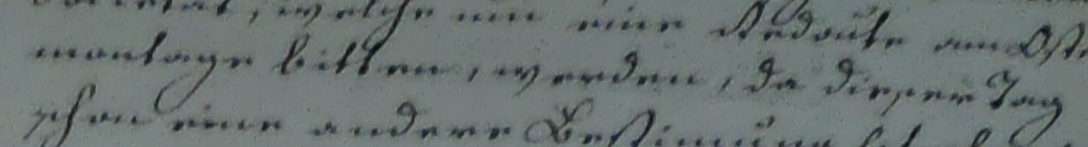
montage bitten, werden, da dieser Tag
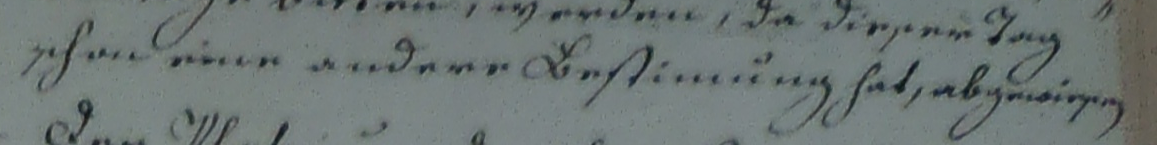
schon eine andere Bestimung hat, abgewiesen
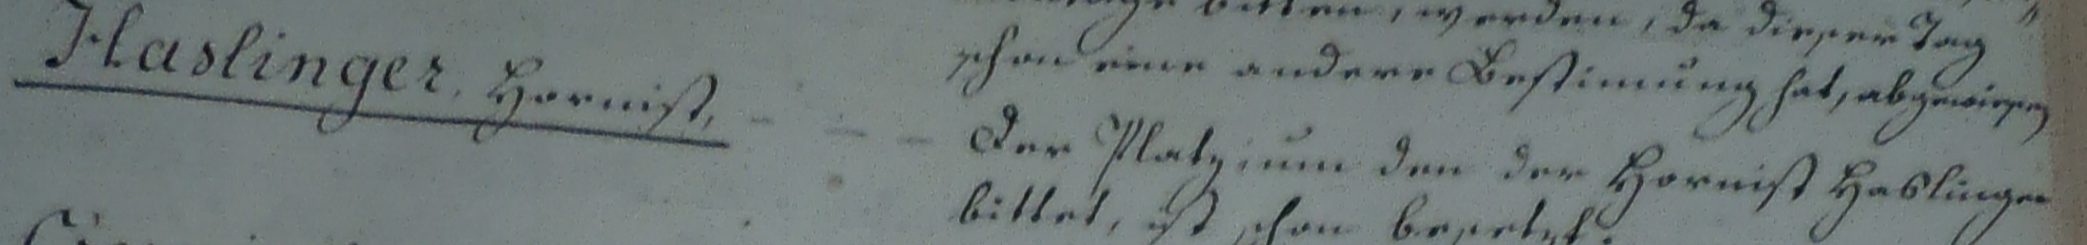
Haslinger, Hornist, _ _ _ Der Platz, um den der Hornist Haslinger
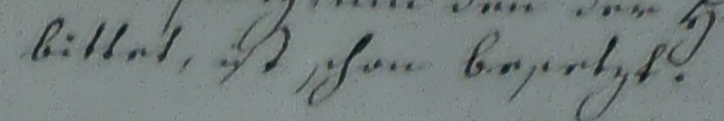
bittet, ist schon besetzt.
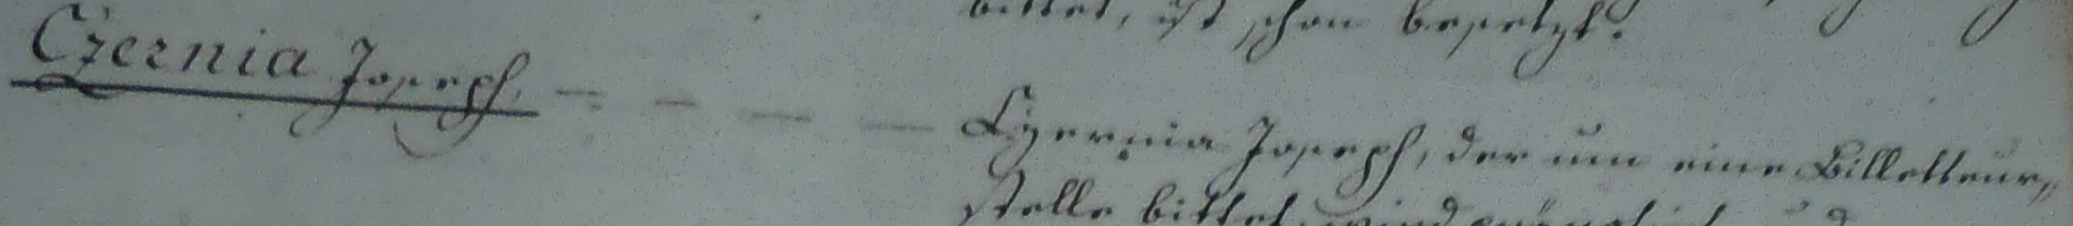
Czernia Joseph, _ _ _ _ Czernia Joseph, der um eine Billetteur¬
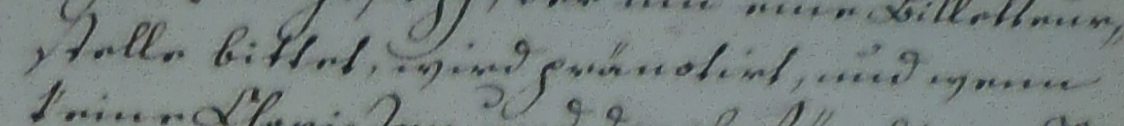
stelle bittet, wird pränotirt, und wenn
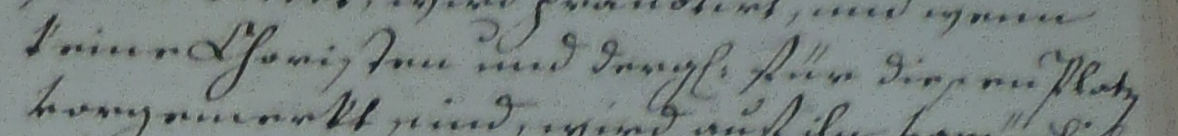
keine Choristen und dergE: für diesen Platz
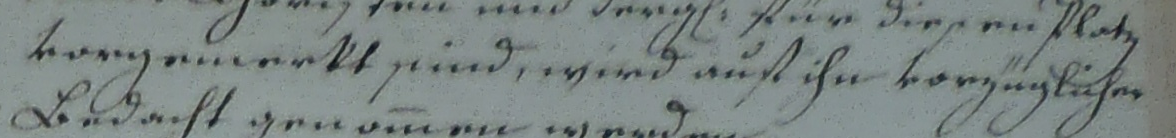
vorgemerkt sind, wird auf ihn vorzüglicher
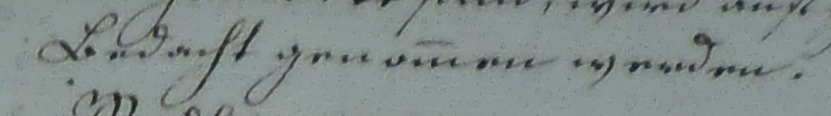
Bedacht genommen werden.
